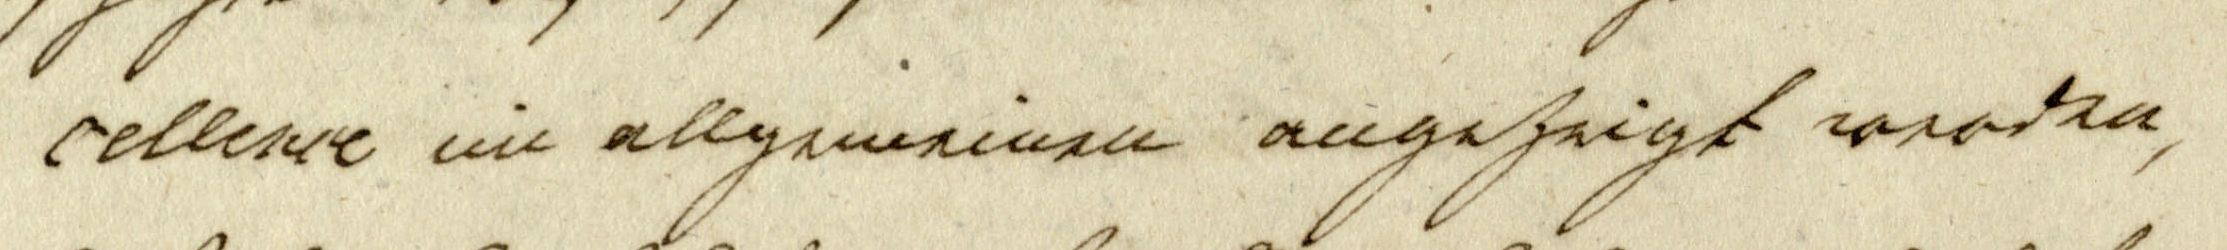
cellence im allgemeinen angezeigt werden,
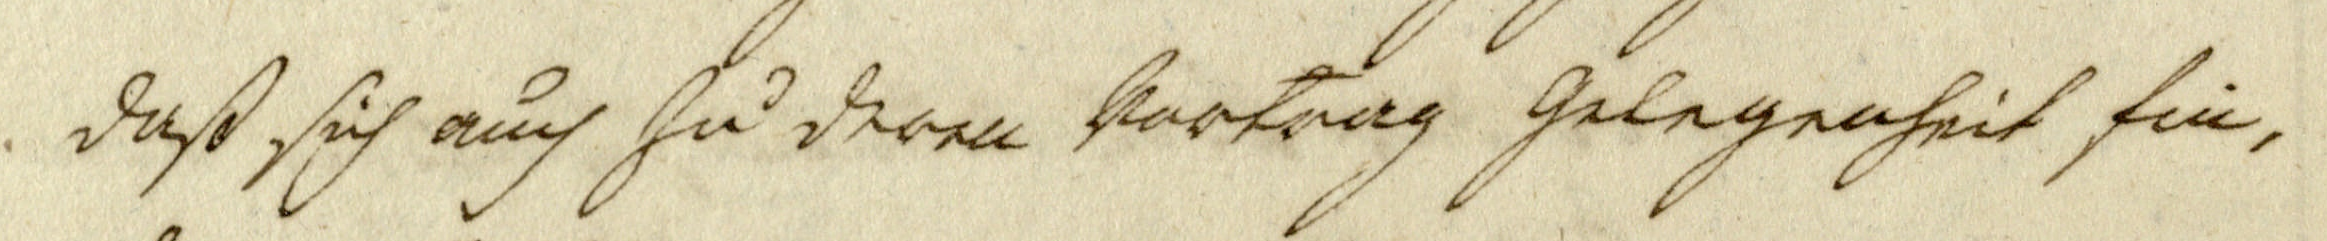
daß sich auch zu deren Vortrag Gelegenheit fin¬
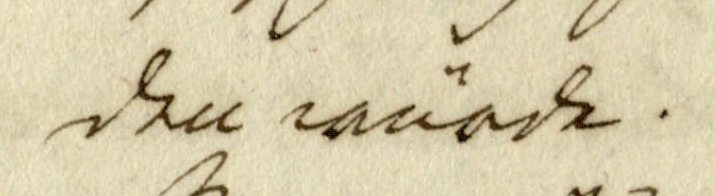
den würde.
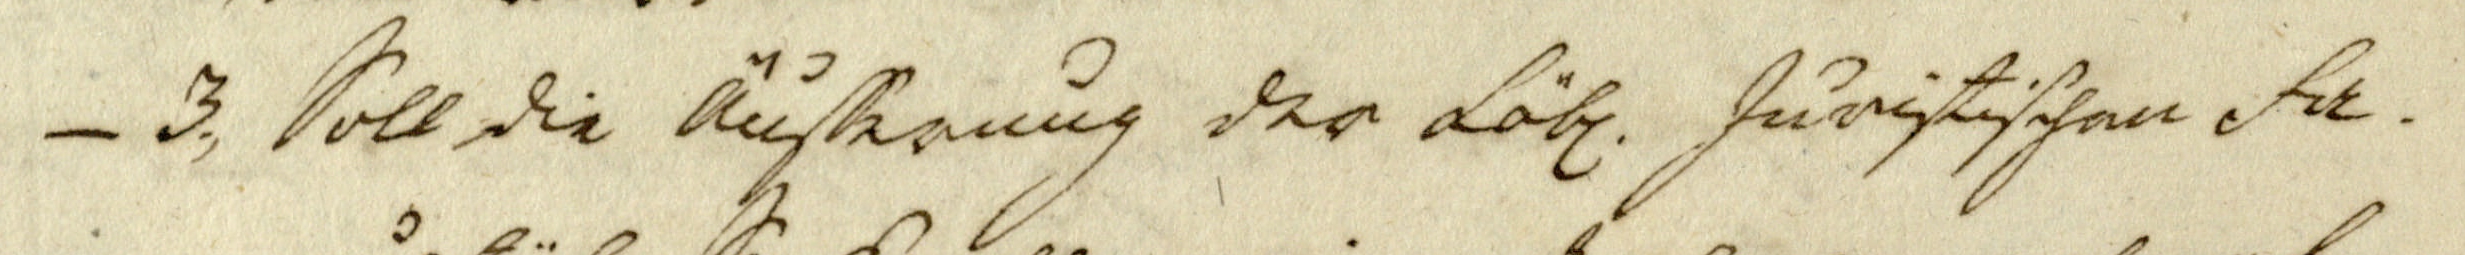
3., Soll die Äusserung der Löbl. Juristischen Fa¬
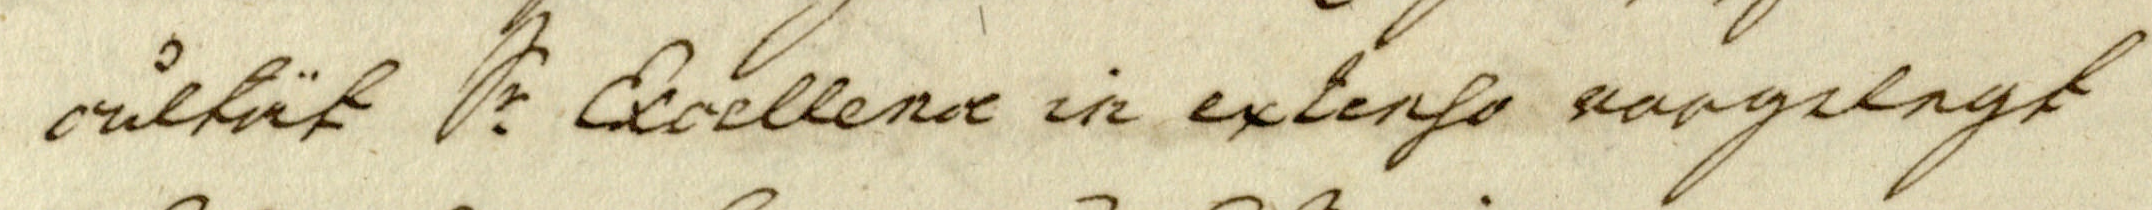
cultät Sr. Excellence in extenso vorgelegt
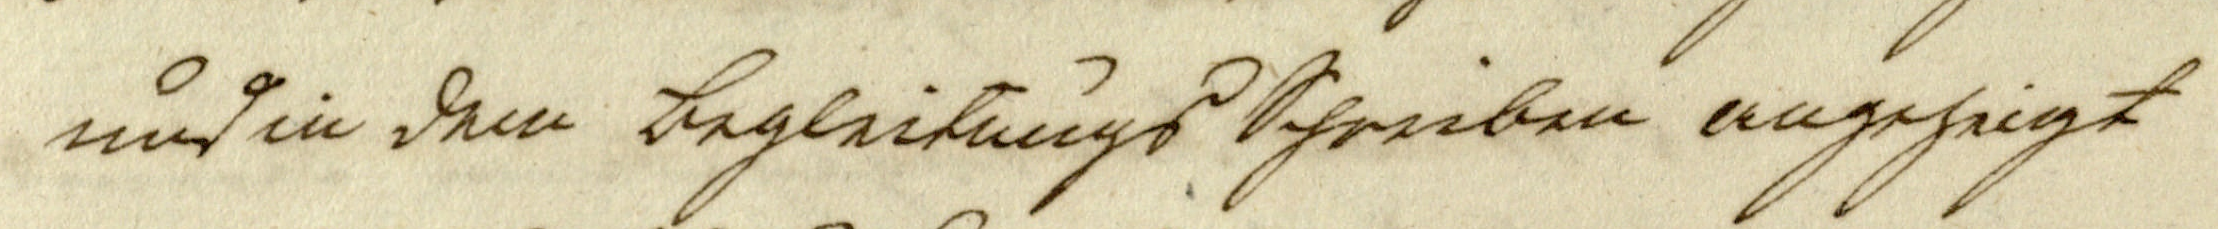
und in dem Begleitungs Schreiben angezeigt
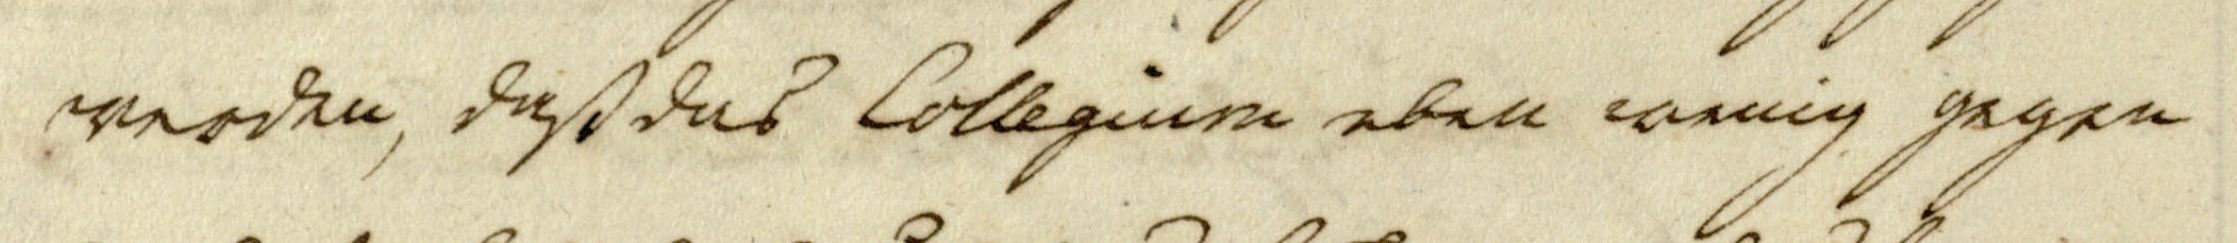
werden, daß das Collegium eben wenig gegen
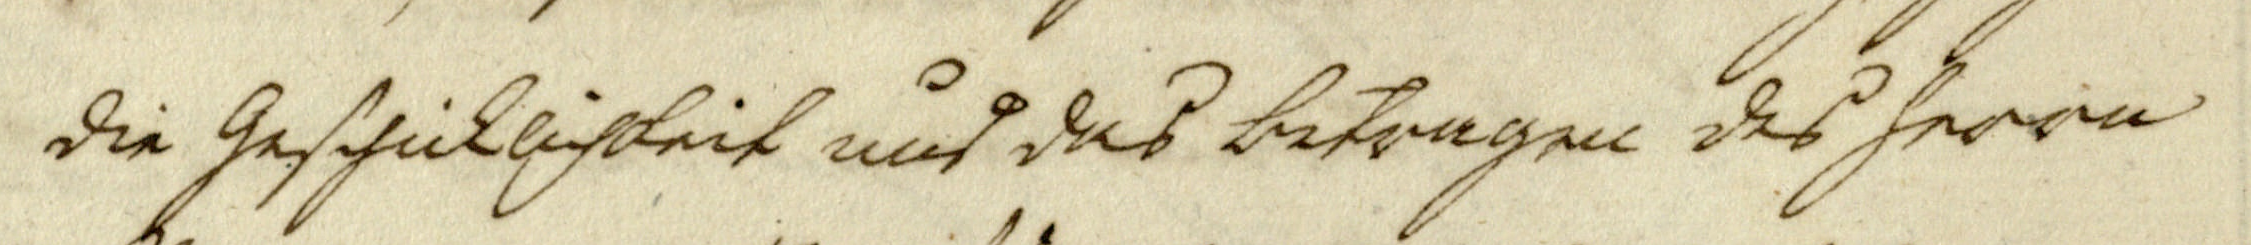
die Geschicklichkeit und das Betragen des herrn
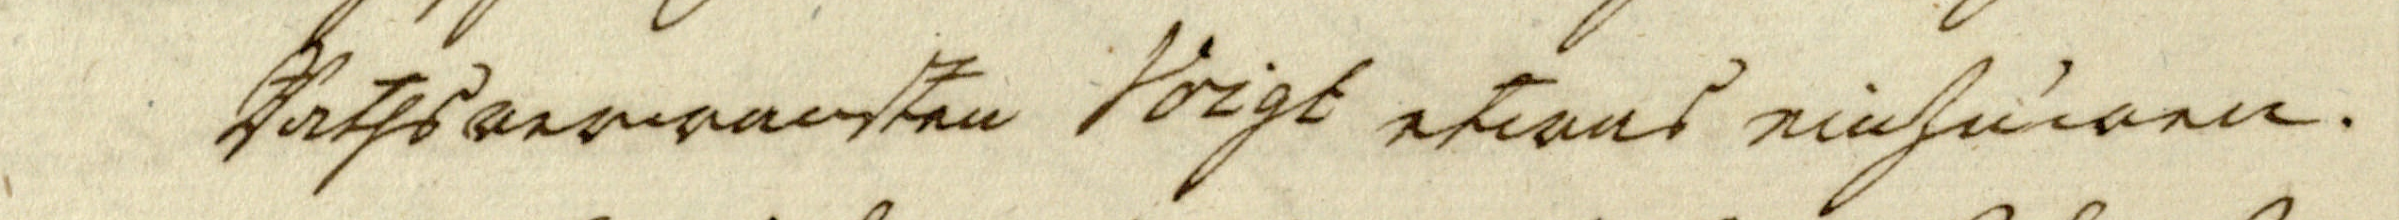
Rathsverwandten Voigt etwas einzuwen¬
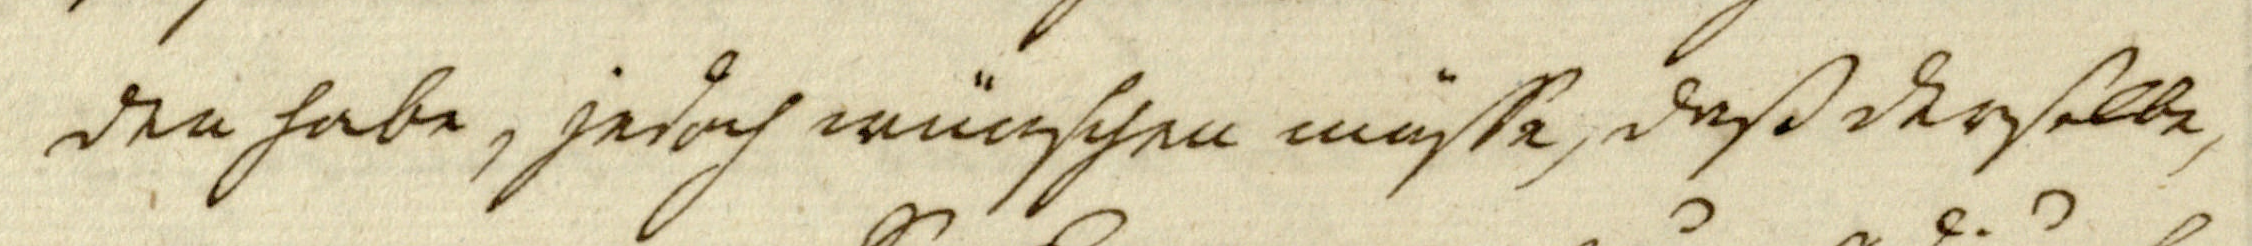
den habe, jedoch wünschen müsse, daß derselbe,
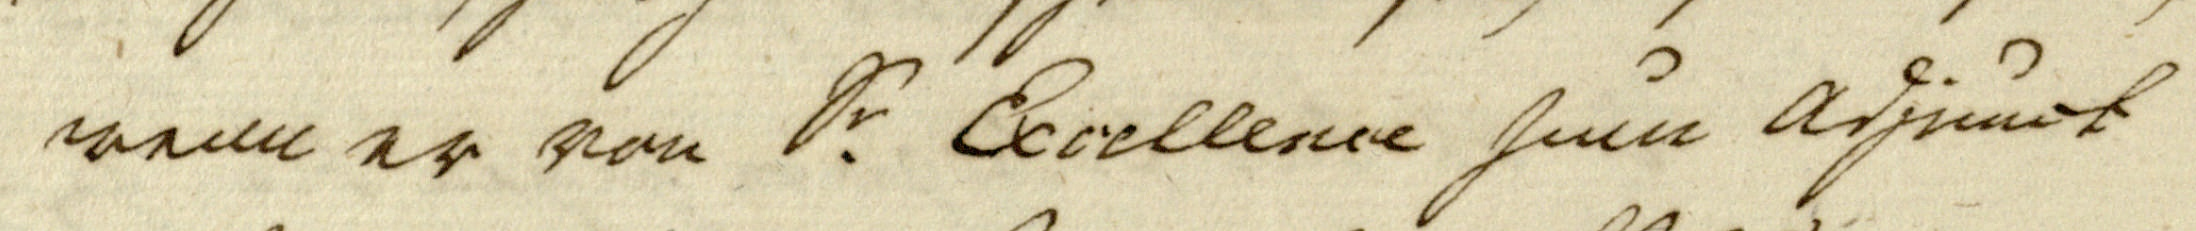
wenn er von Sr. Excellence zum Adjunct
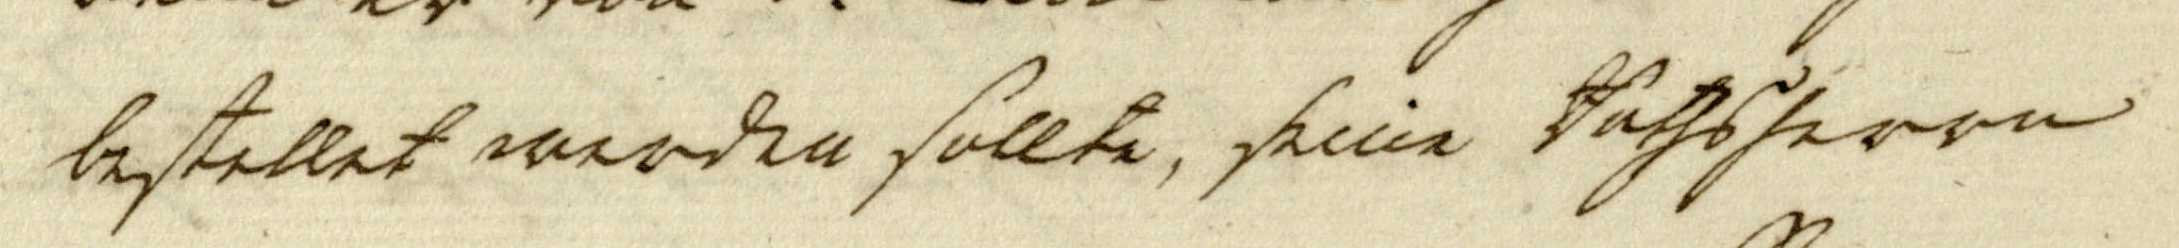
bestellet werden sollte, seine Rathsherrn
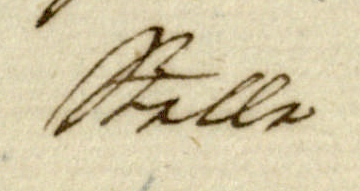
Stelle
